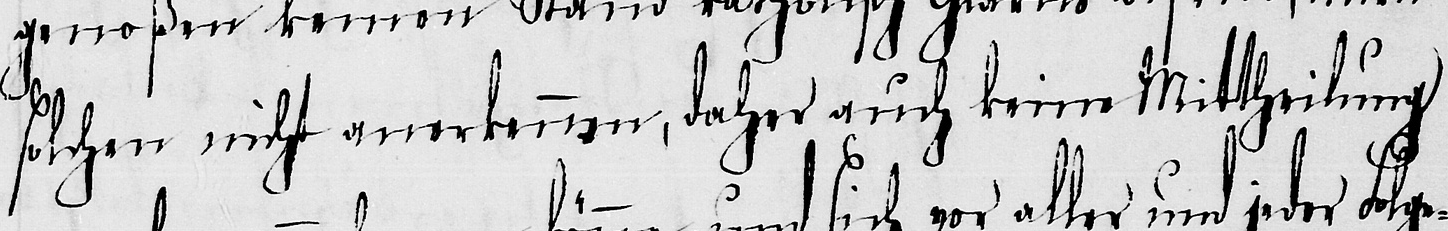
solchen nicht anerkennen, daher auch keine Mittheilung
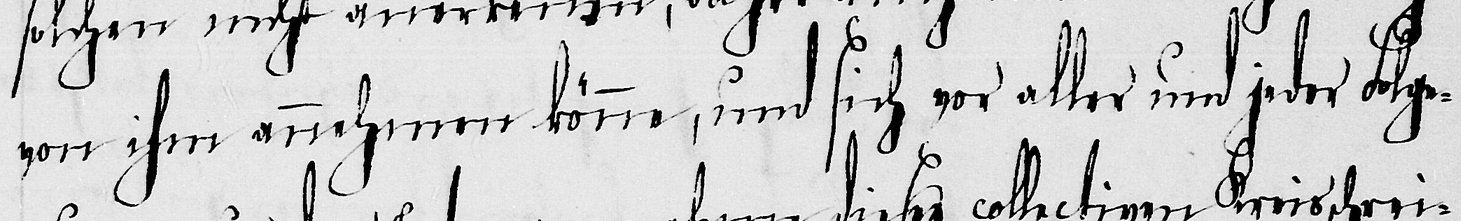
von ihm annehmen könne, und sich vor aller und jeder Folge¬
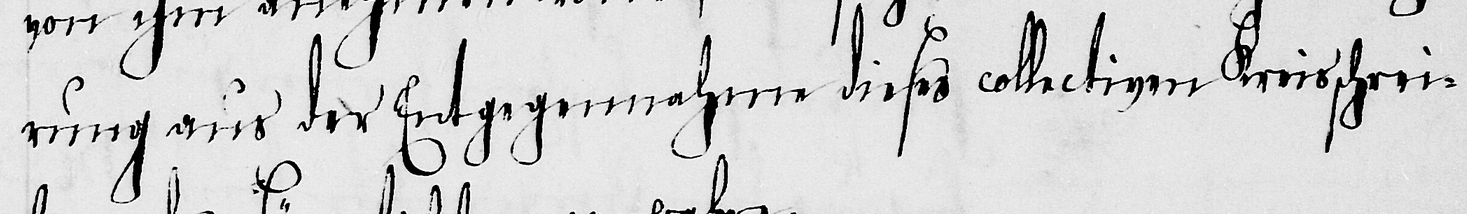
rung aus der Entgegennahme dieses collectiven Kreisschrei¬
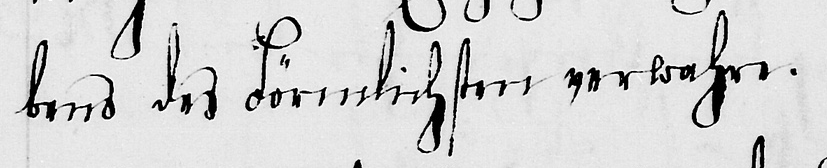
bens des Förmlichsten verwahre.
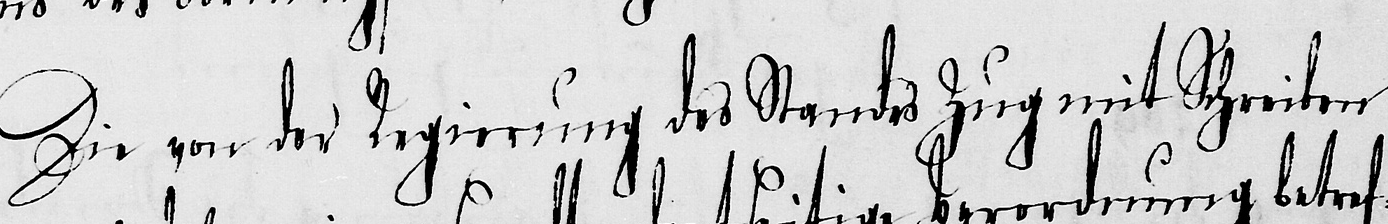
Die von der Regierung des Standes Zug mit Schreiben
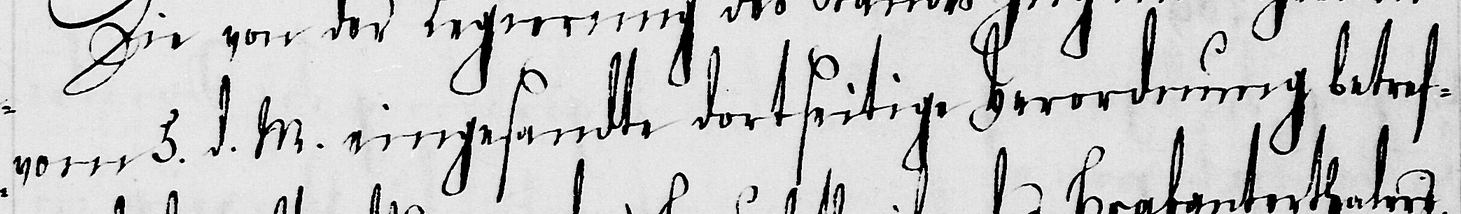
vom 5. d. M. eingesandte dortseitige Verordnung betref¬
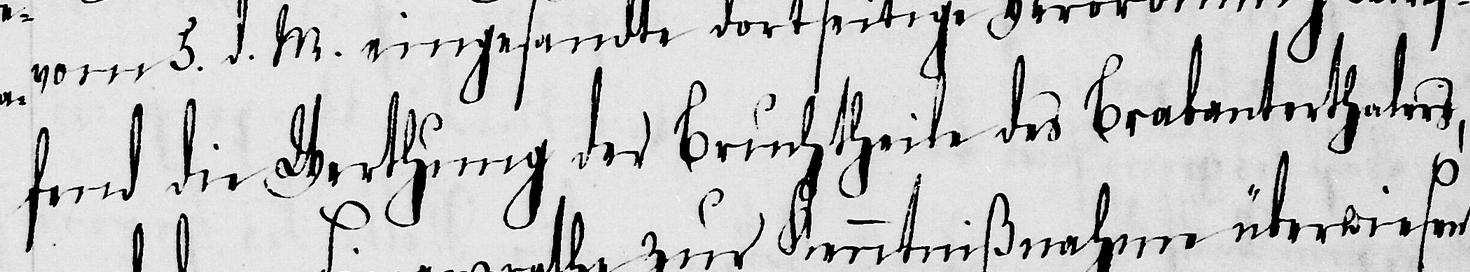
fend die Werthung der Bruchtheile des Brabanterthaler¬
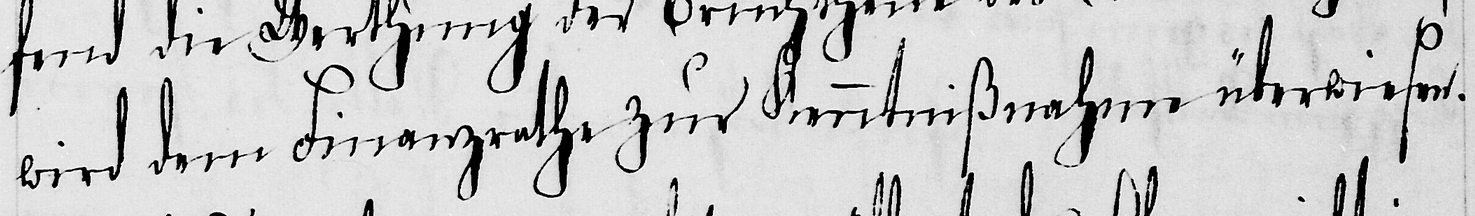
wird dem Finanzrathe zur Kenntnißnahme überwiesen.
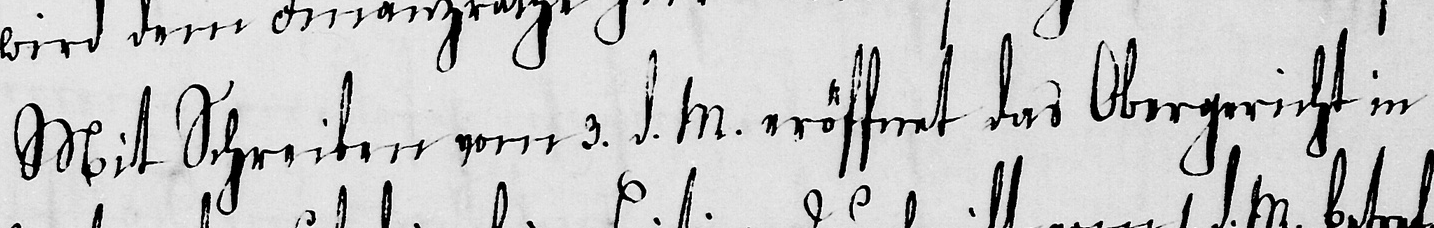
Mit Schreiben vom 3. d. M. eröffnet das Obergericht in
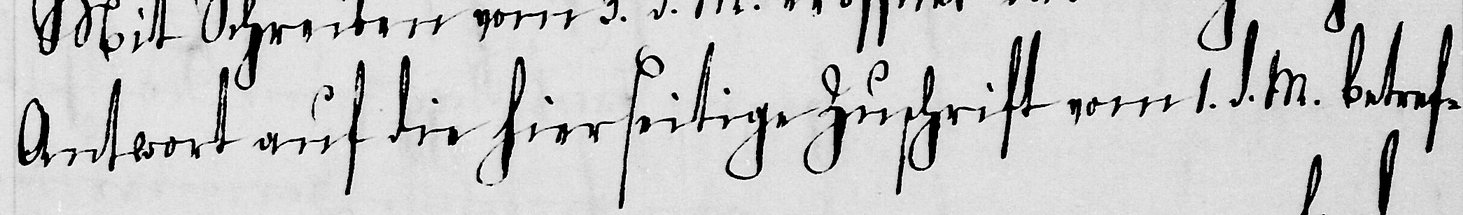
Antwort auf die hierseitige Zuschrift vom 1. d. M. betr¬
